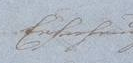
noch weitere
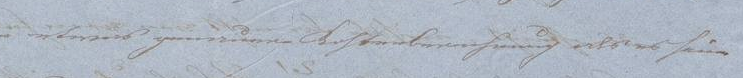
gehend eine etwas genauere Kostenberechnung als es seine
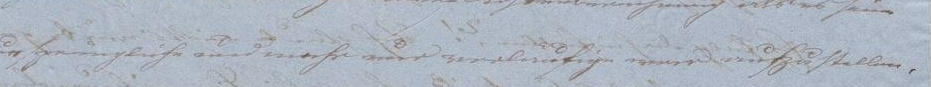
ursprüngliche und mehr nur vorläufige war aufzustellen.
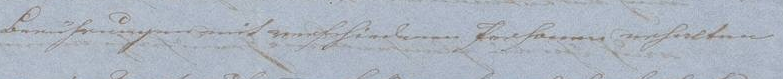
meine Berührungen mit verschiedenen Personen erhalten
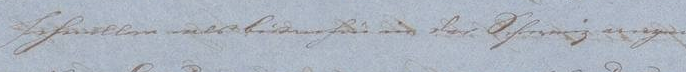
schneller als bisanhin in der Schweiz angenommen
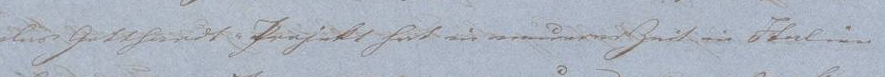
das Gotthardt-Projekt hat in neuerer Zeit in Italien
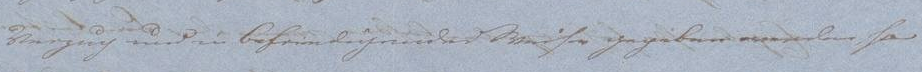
Verzug und in befriedigender Weise gegeben werden, so
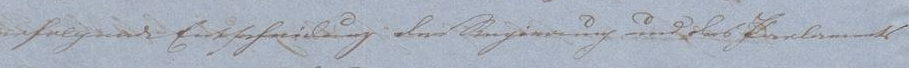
erfolgende Entscheidung der Regierung und des Parlaments
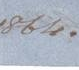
Peyer
